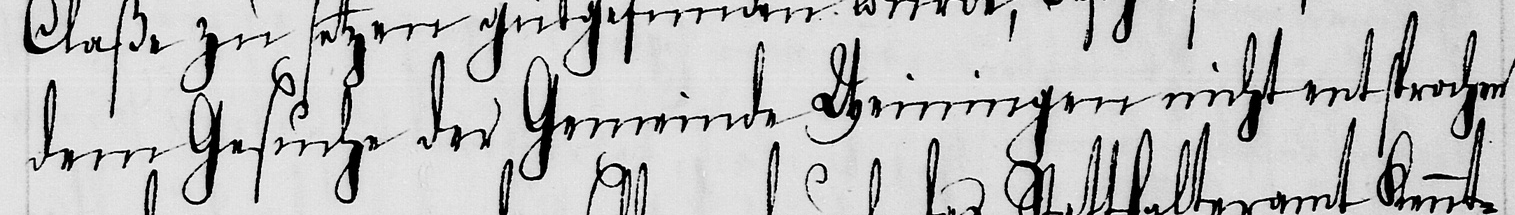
dem Gesuche der Gemeinde Weiningen nicht entsprochen
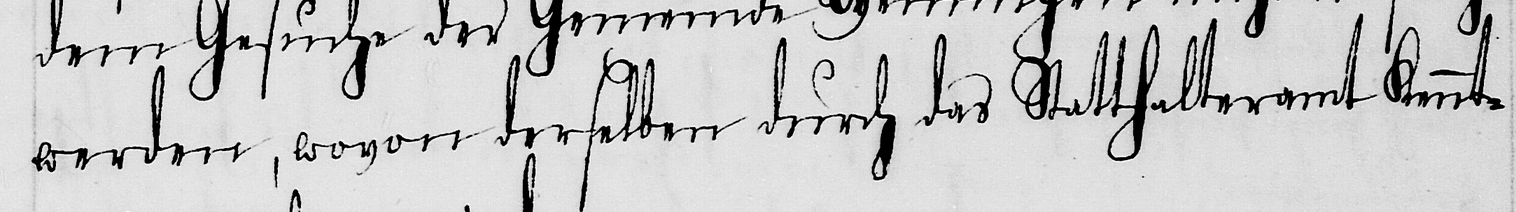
werden, wovon derselben durch das Statthalteramt Kennt¬
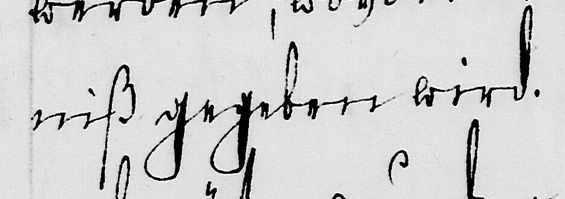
niß gegeben wird.
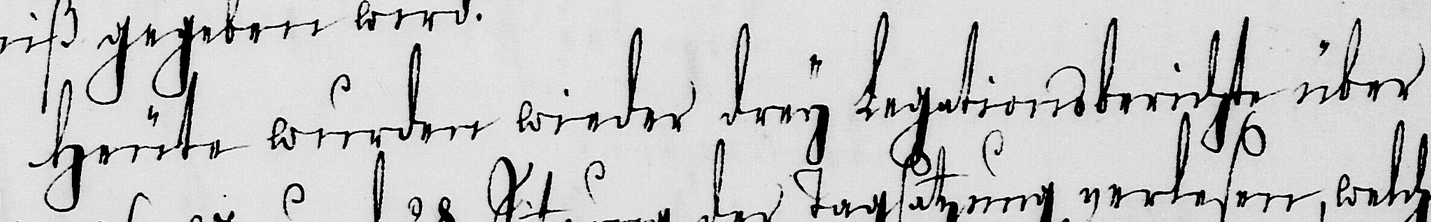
Heute wurden wieder drey Legationsberichte über
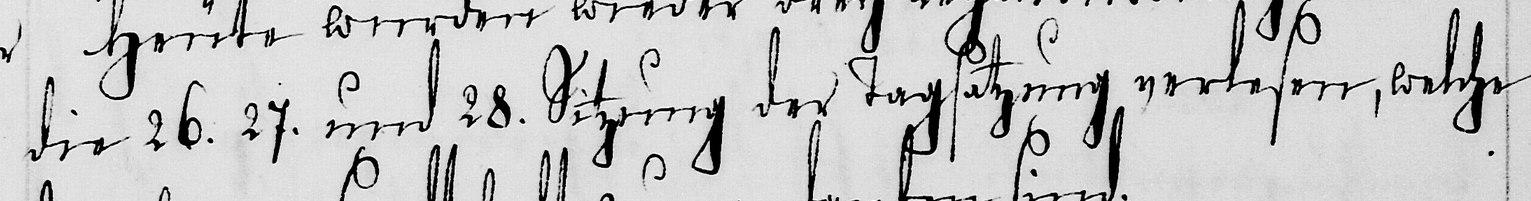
die 26. 27. und 28. Sitzung der Tagsatzung verlesen, welche
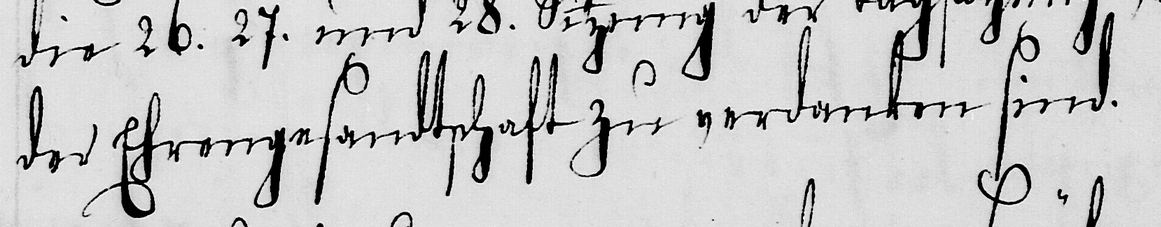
der Ehrengesandtschaft zu verdanken sind.
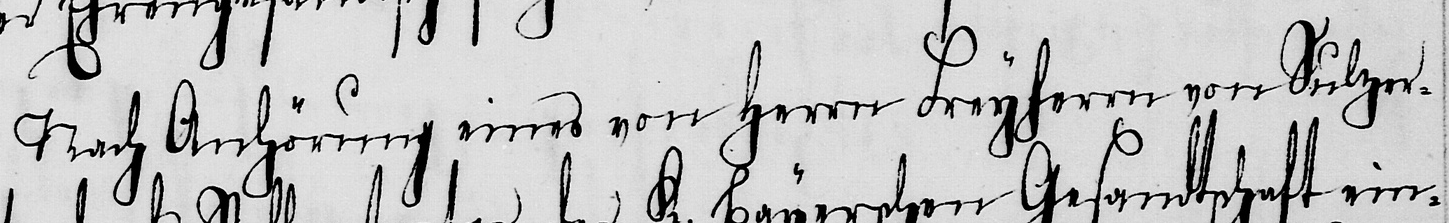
Nach Anhörung eines von Herrn Freyherrn von Sulze¬
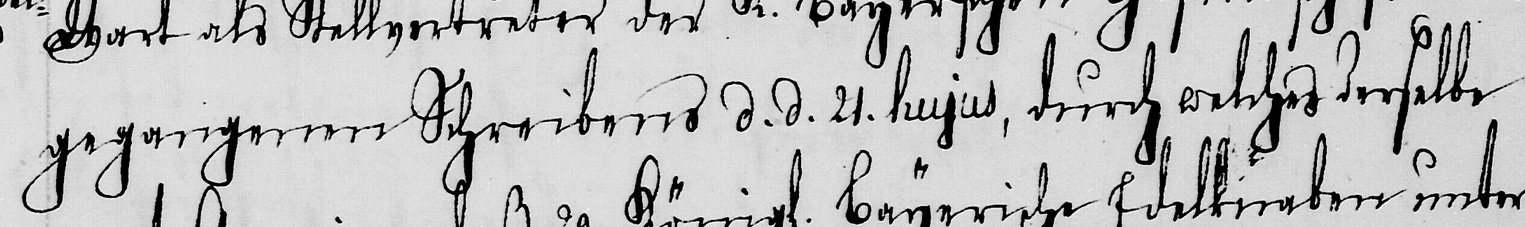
gegangenen Schreibens d. d. 21. hujus, durch welches derselbe
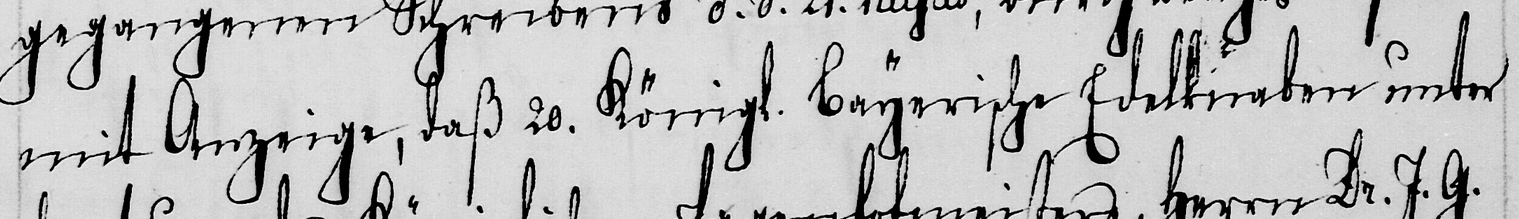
mit Anzeige, daß 20. Königl. Bayerische Edelknaben unter
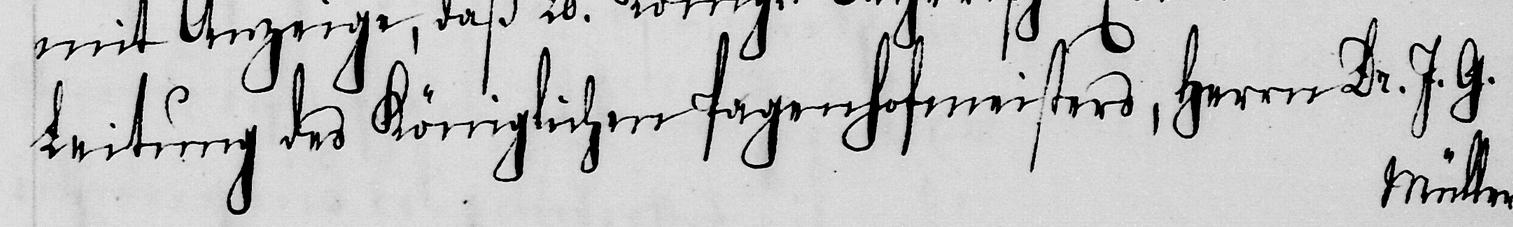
Leitung des Königlichen Pagenhofmeisters, Herrn Dr. J.
